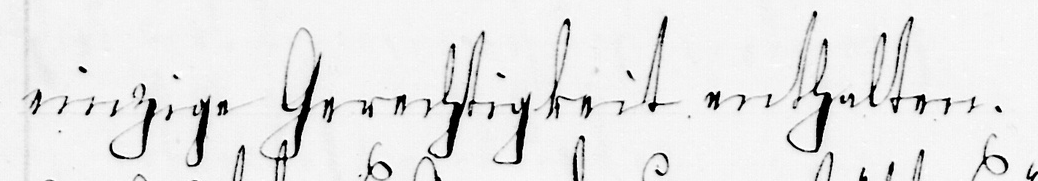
einzige Gerechtigkeit enthalten.
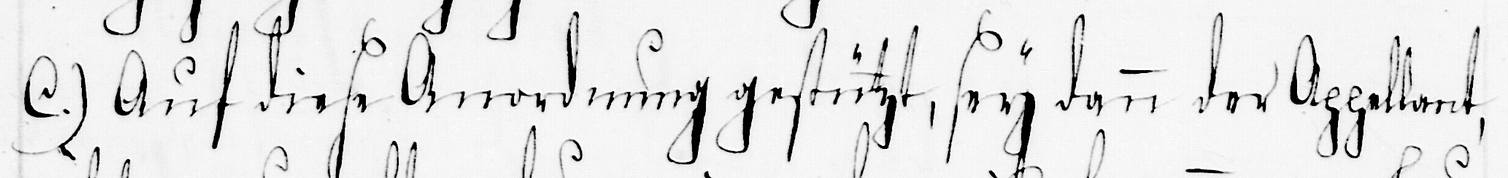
C.) Auf diese Anordnung gestützt, sey dann der Appellan¬
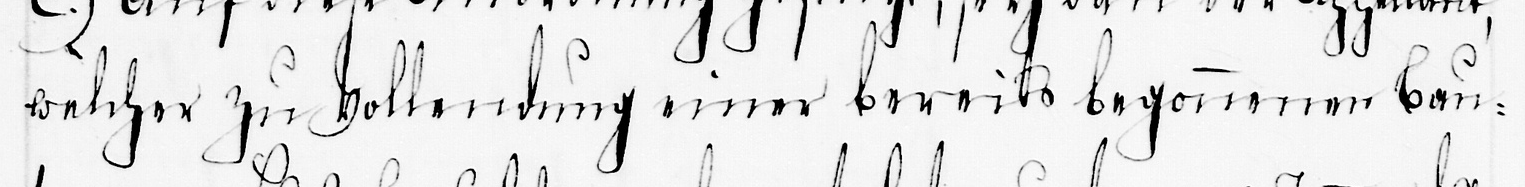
welcher zu Vollendung einer bereits begonnenen Bau¬
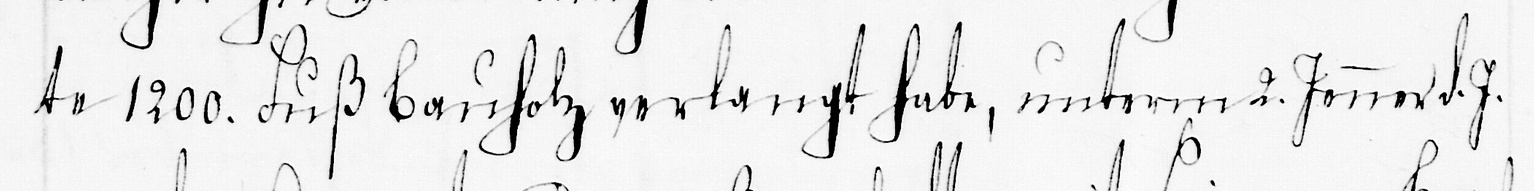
te 1200. Fuß Bauholz verlangt habe, unterm 2. Jenner d.
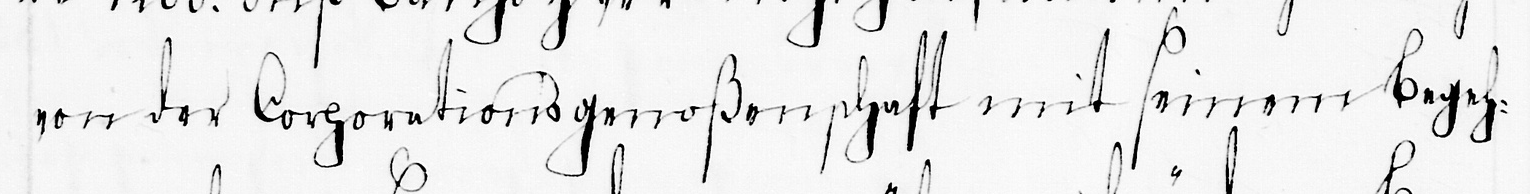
von der Corporationsgenoßenschaft mit seinem Begeh¬
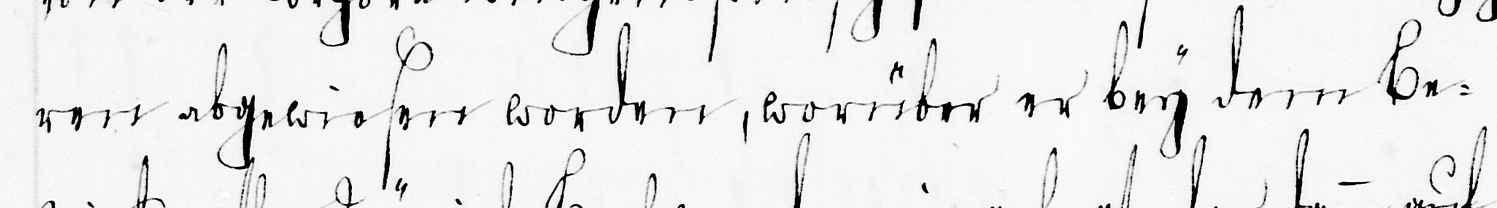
ren abgewiesen worden, worüber er bey dem Be¬
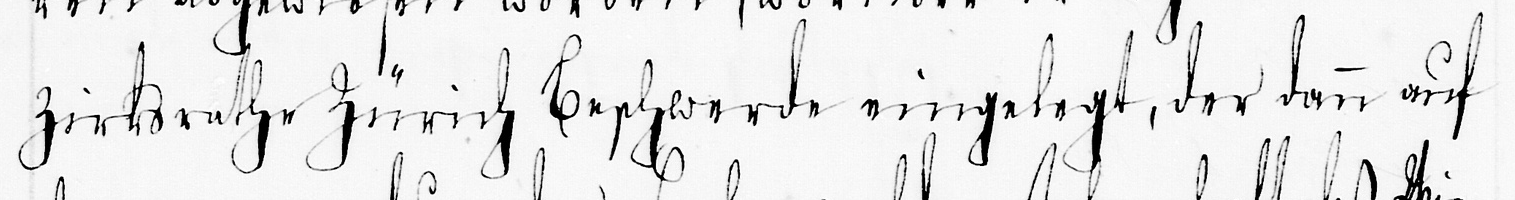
zirksrathe Zürich Beschwerde eingelegt, der dann auf
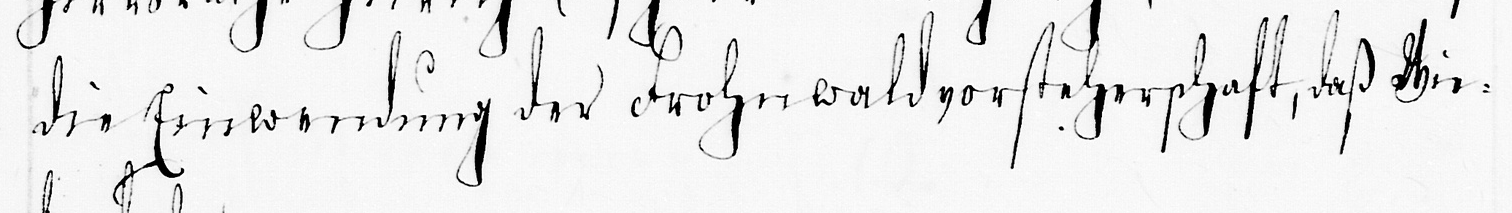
die Einwendung der Frohnwaldvorsteherschaft, daß Wie¬
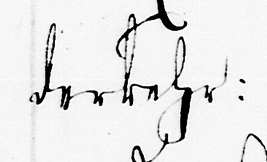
derkehr:
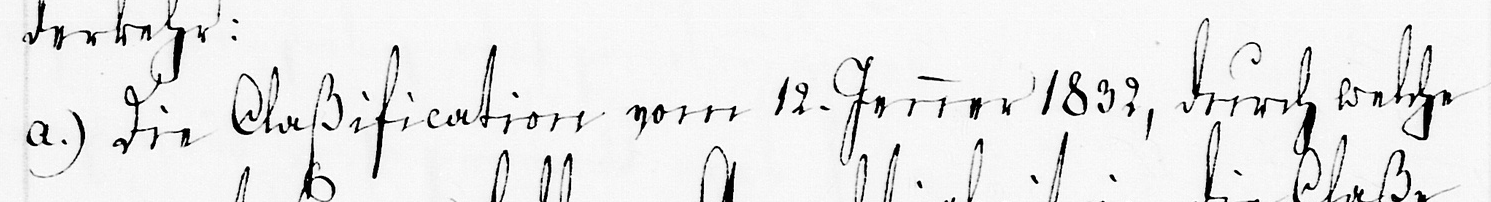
a.) Die Claßification vom 12. Jenner 1832, durch welche
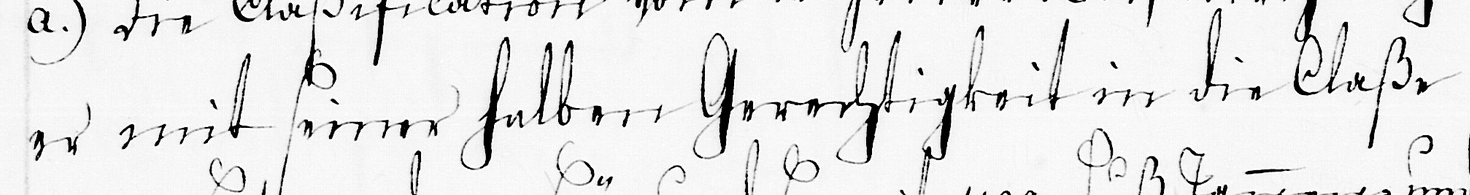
er mit seiner halben Gerechtigkeit in die Claße
